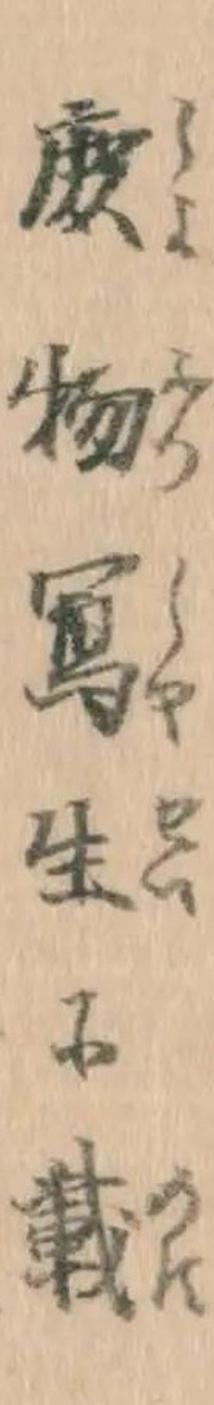庶物写生に載
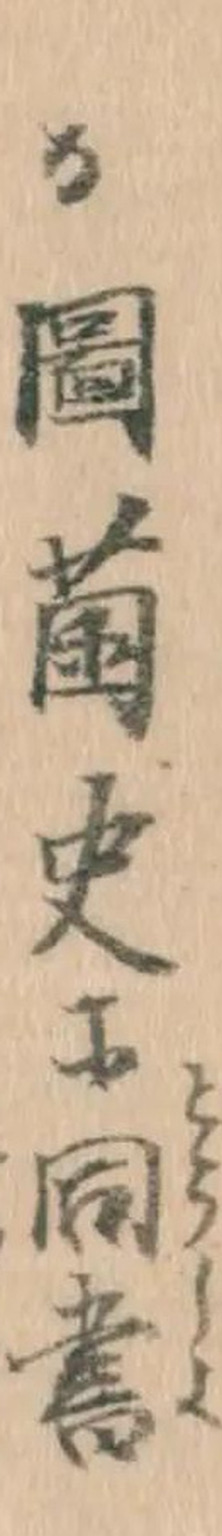る図菌史に同書
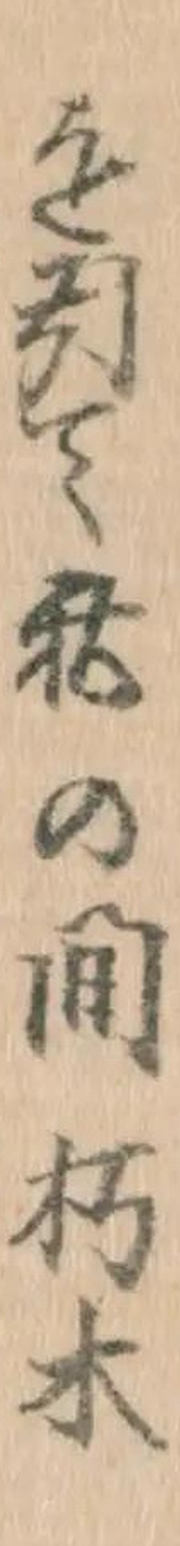を引て秋の間朽木
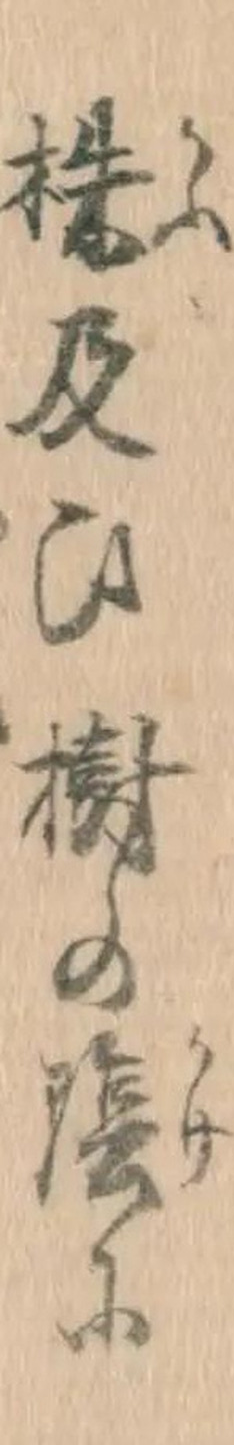株及ひ樹の陰に
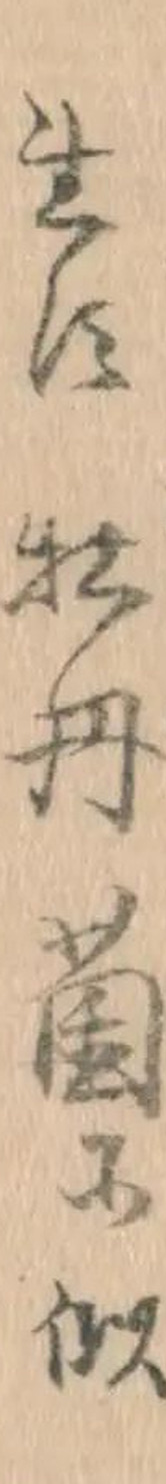生す牡丹菌に似
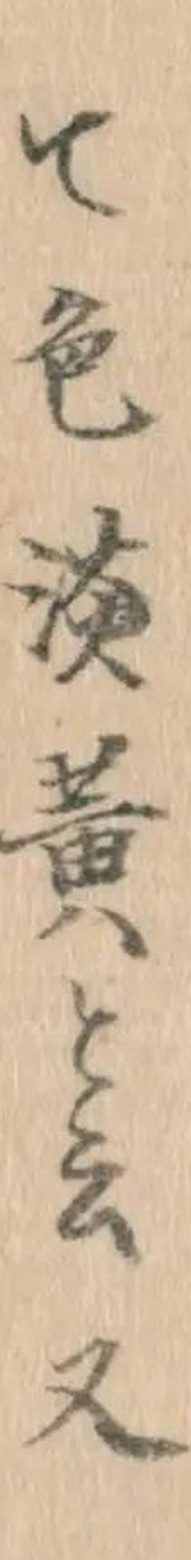て色淡黄と云又
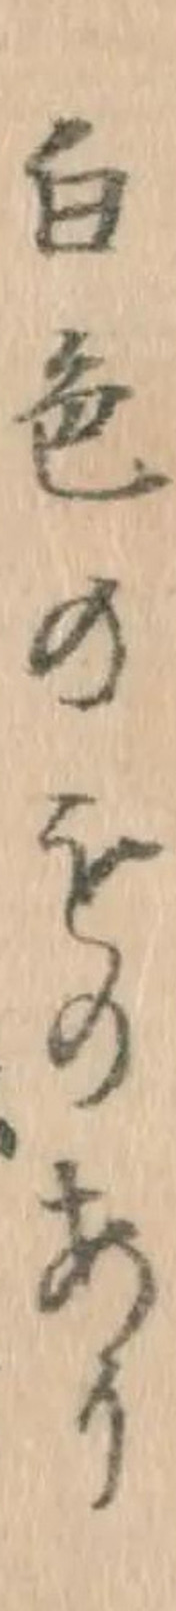白色のものあり
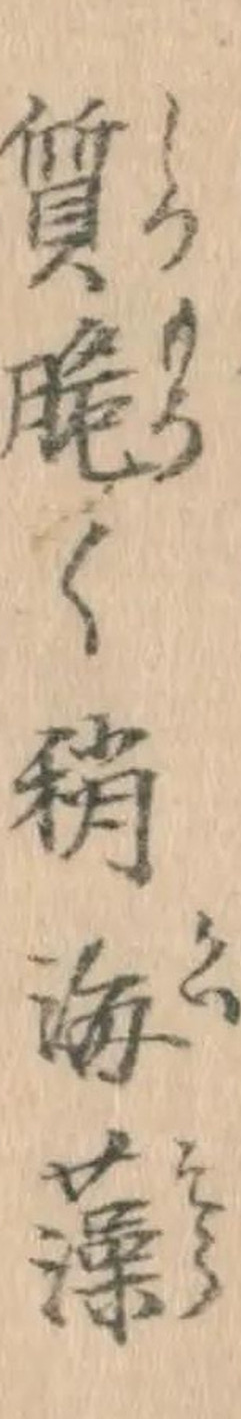質脆く稍海藻
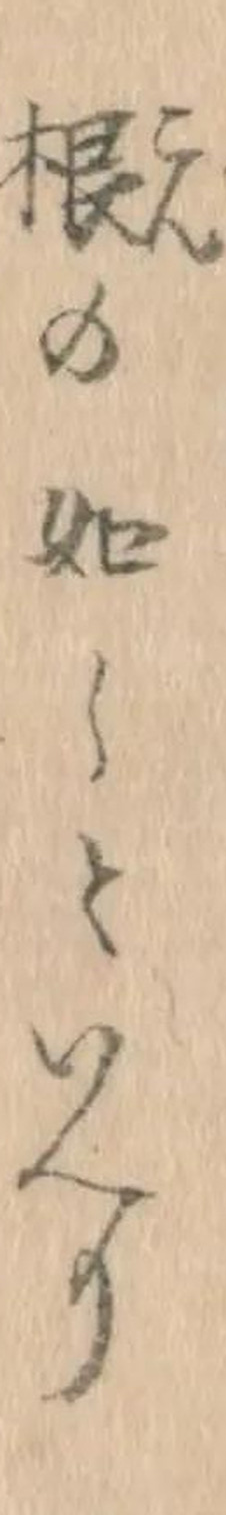根の如しといへり

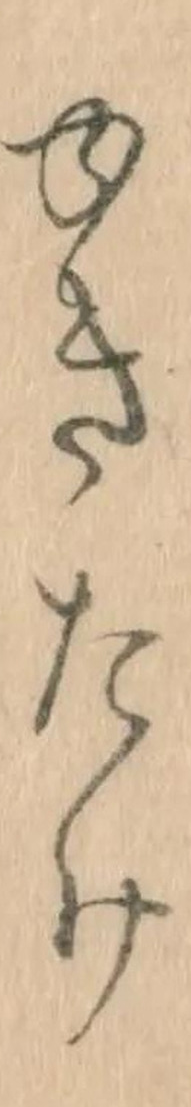ゆきたけ
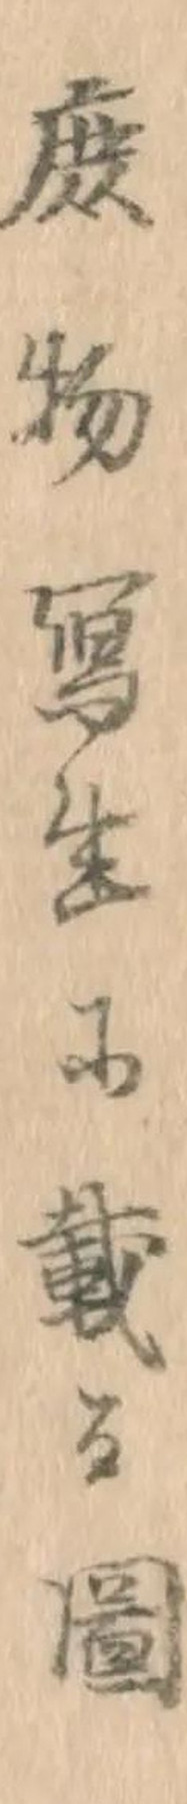庶物写生に載る図
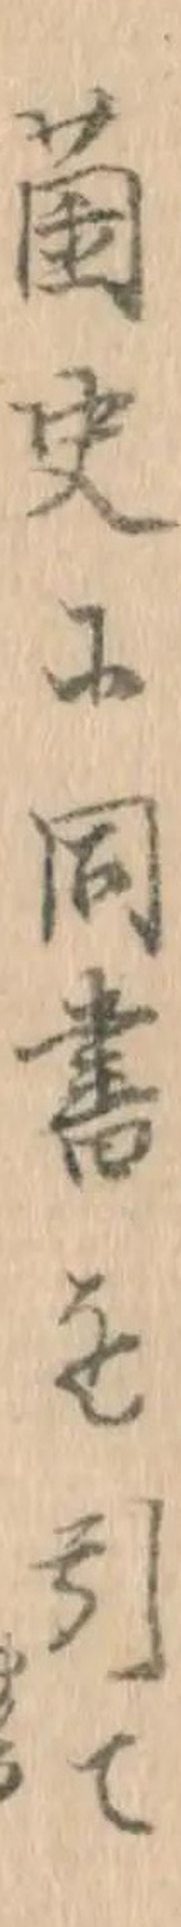菌史に同書を引て
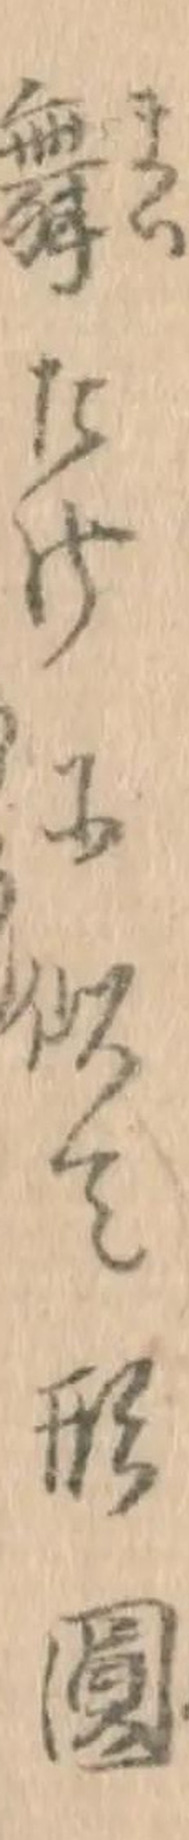舞たけに似て形円
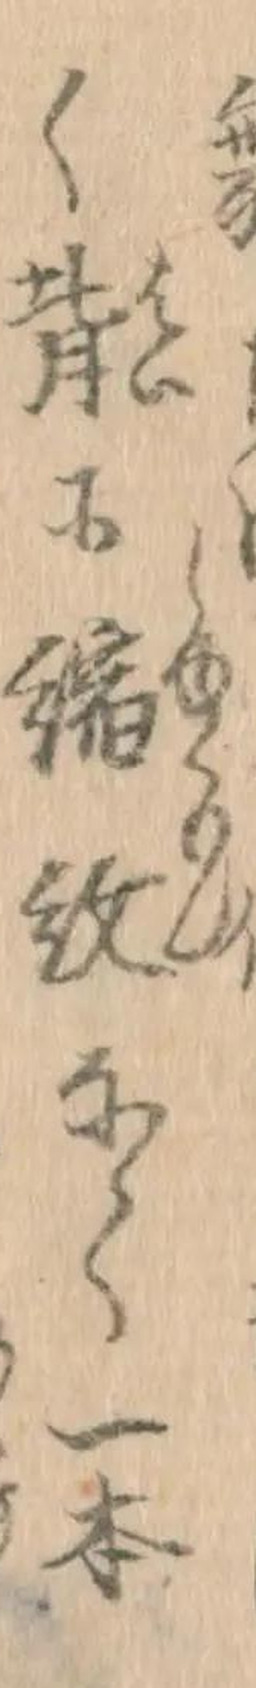く背に縮紋なく一本
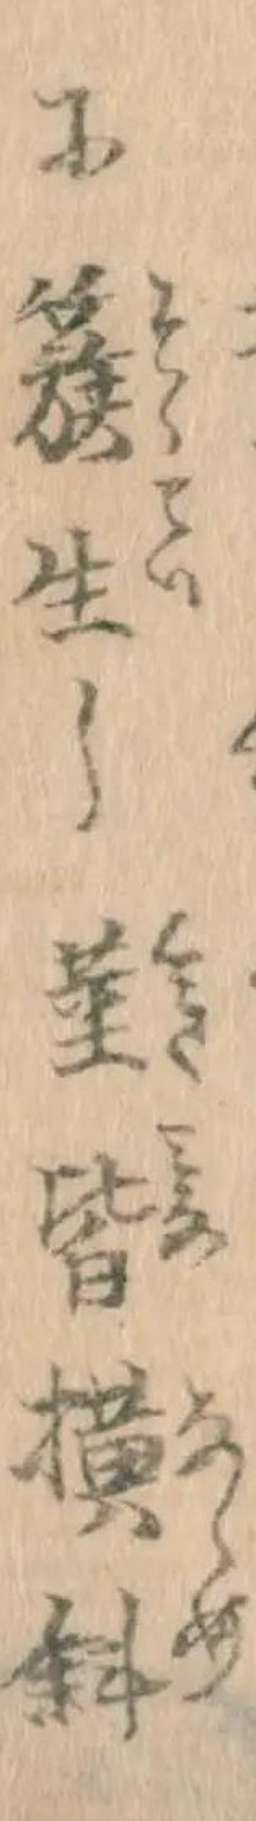に簇生し茎皆横斜
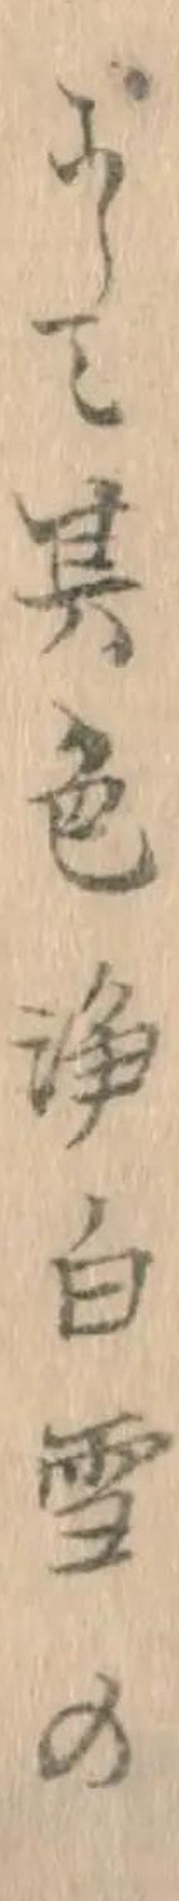にして其色浄白雪の
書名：本草図譜. 巻58-60
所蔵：国立国会図書館 National Diet Library, JAPAN
